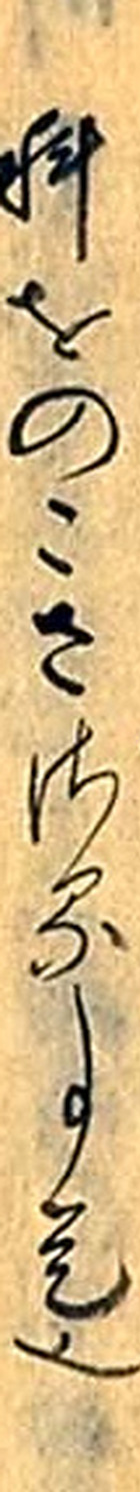科をのこささる事是也
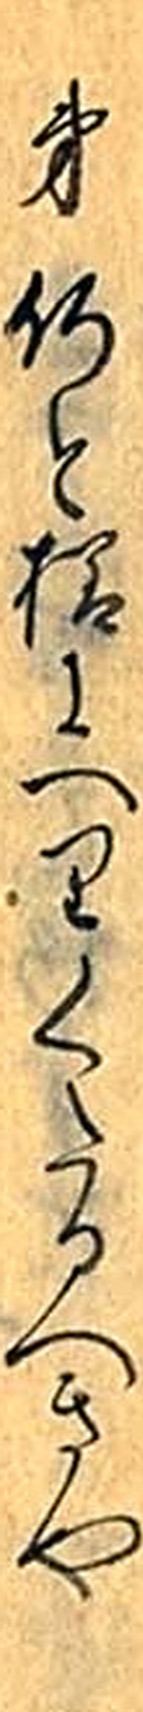弟何と様にへりくたるへきや
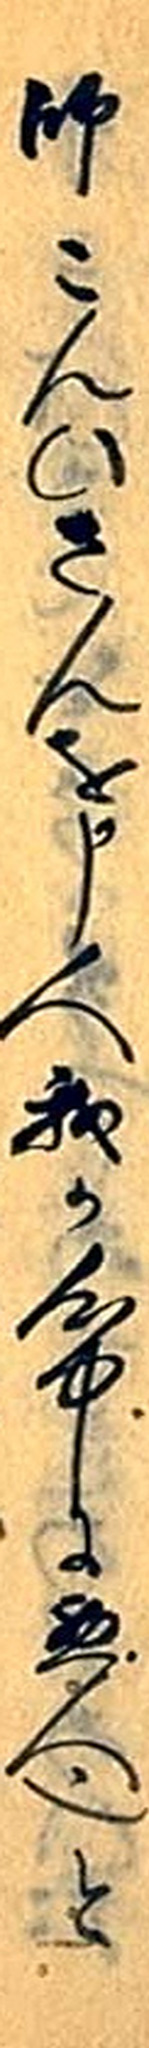師こんひさんを申人我か心中に悪人也と
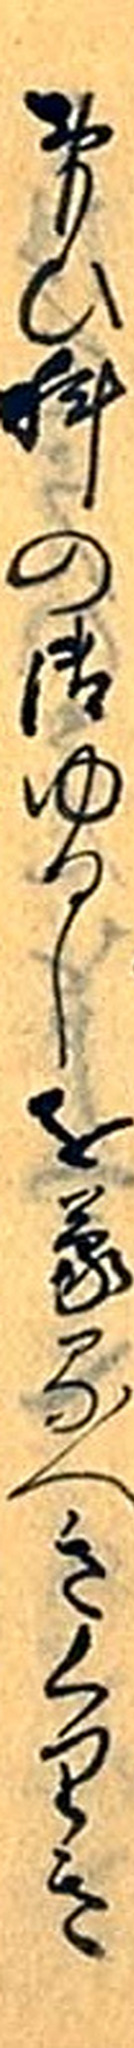おもひ科の御ゆるしを蒙るへきくりき
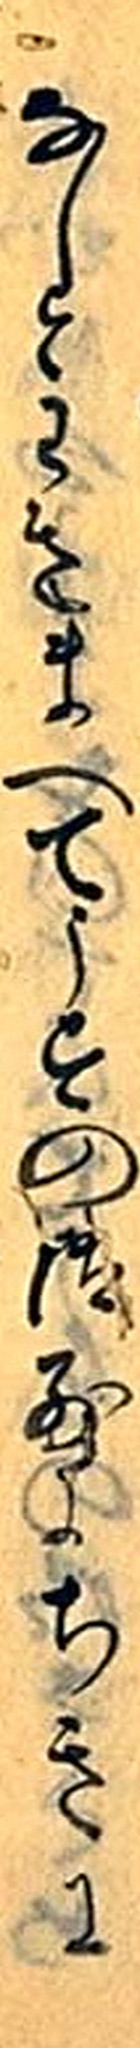なしとわきまへてうすの御前にちきに
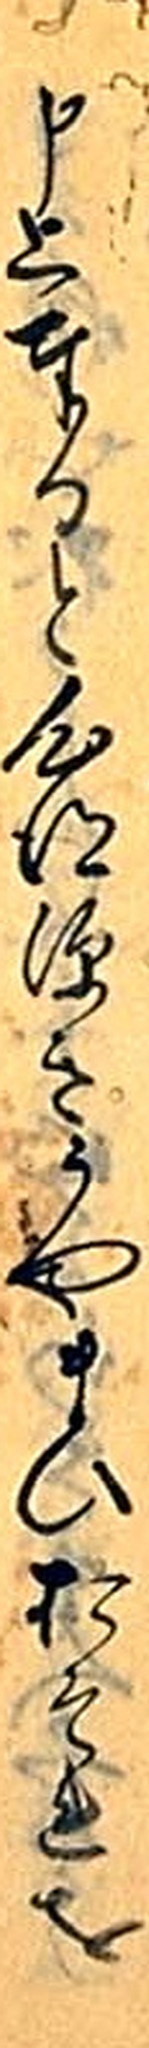申上奉ると心得深きうやまひおそれを
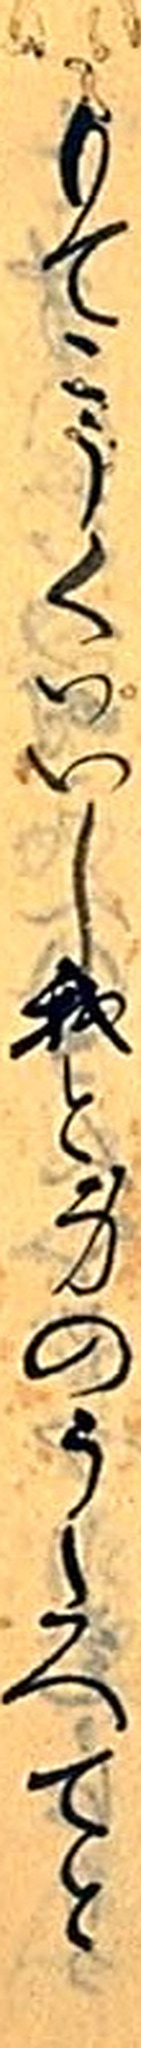もてこうくはいし我と身のうたへてと
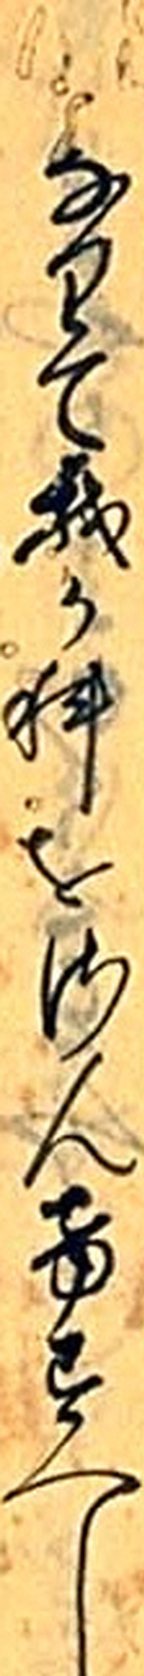なりて我か科をさんけすへし
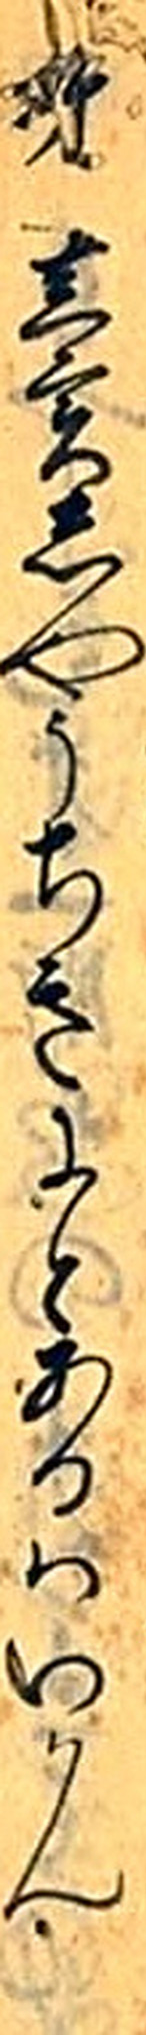弟真実しやうちきにとあるはいかん
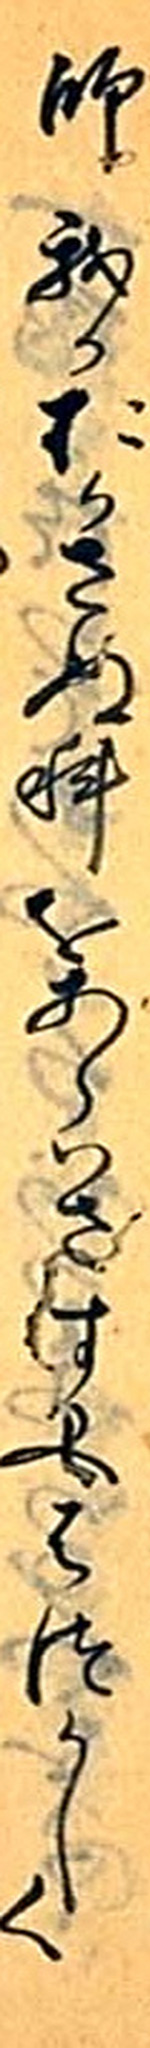師我かおかさぬ科をあらはさす又はつかしく
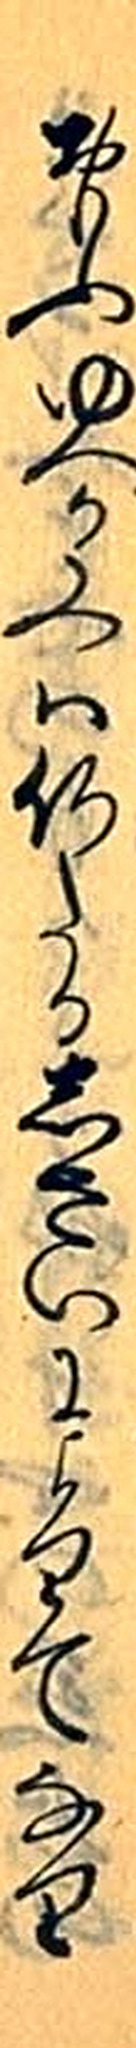おもふゆへか又は何たるしさいによりてなり
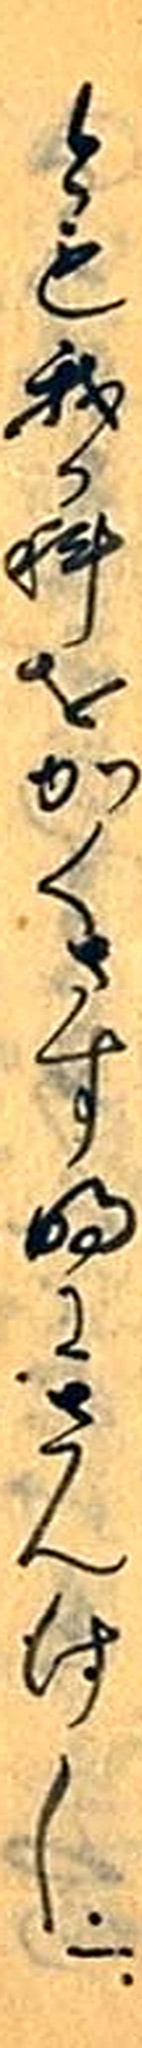とも我か科をかくさす明にさんけし
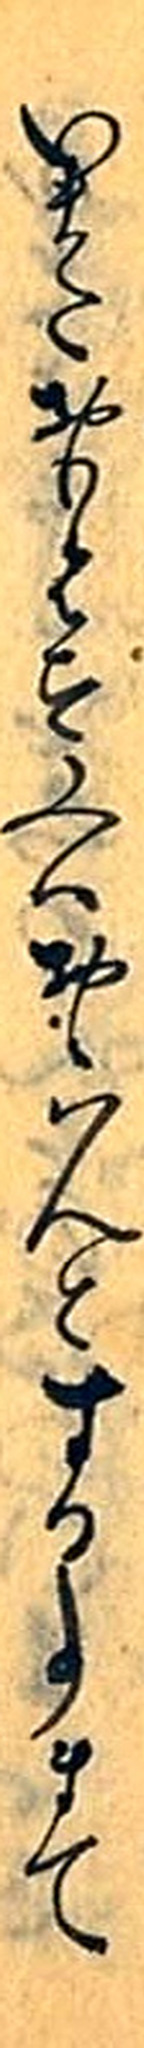いまたおもはす又はおもはんとする事まて
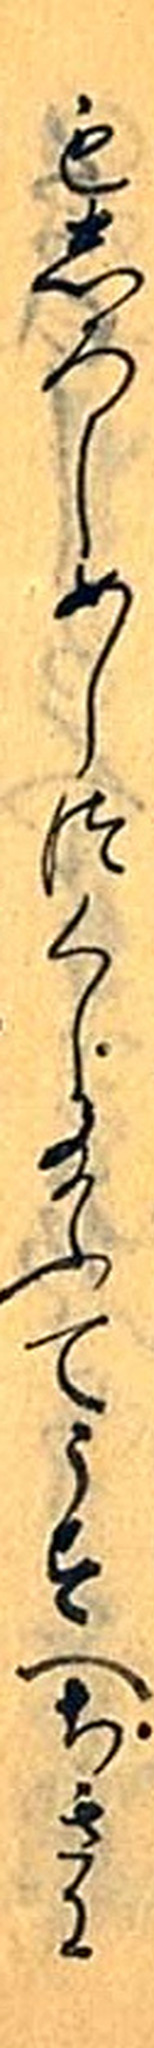もしろしめしつくし給ふてうすへちきに
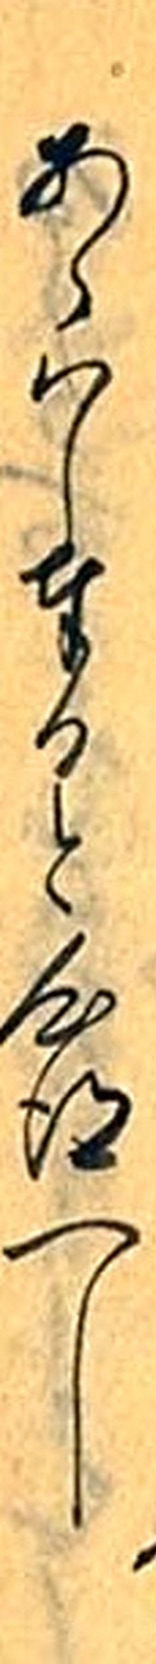あらはし奉ると心得へし
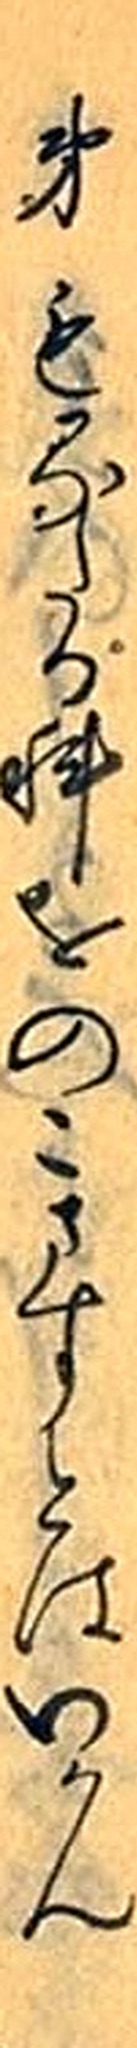弟もるたる科をのこさすとはいかん
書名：ドチリナ・キリシタン
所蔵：東京大学総合図書館 / General Library in the University of Tokyo
